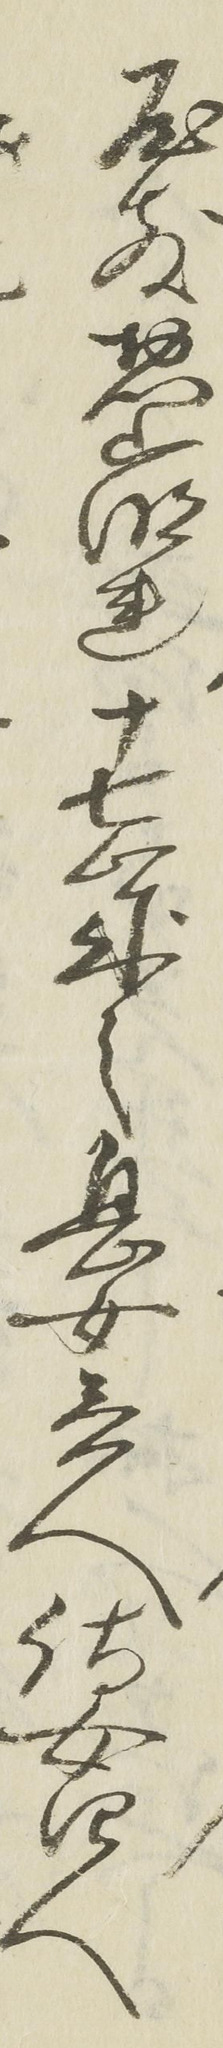屋敷惣崩れ十七歳之息女壱人侍女四人
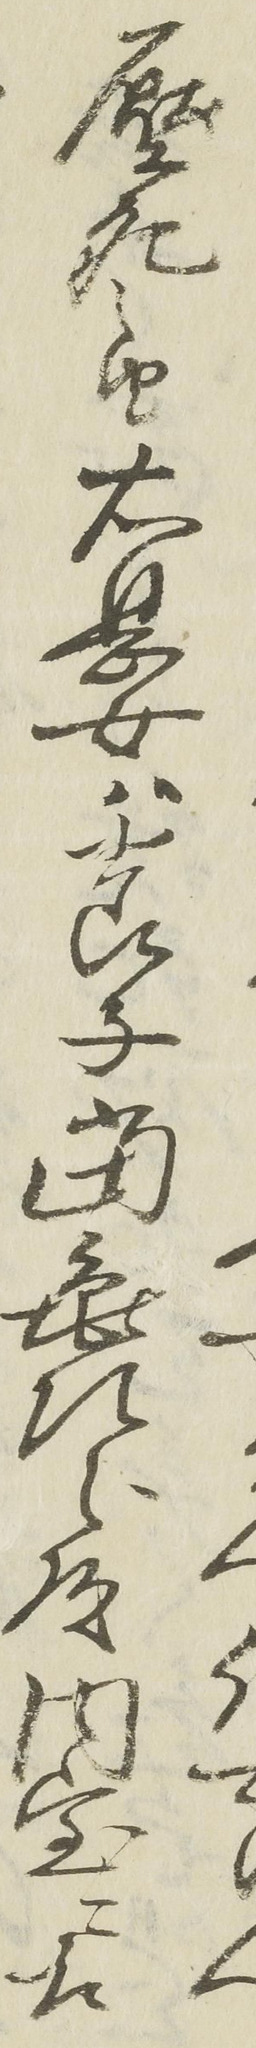圧死之由右息女ハ養子当亀次郎殿内室ニ取
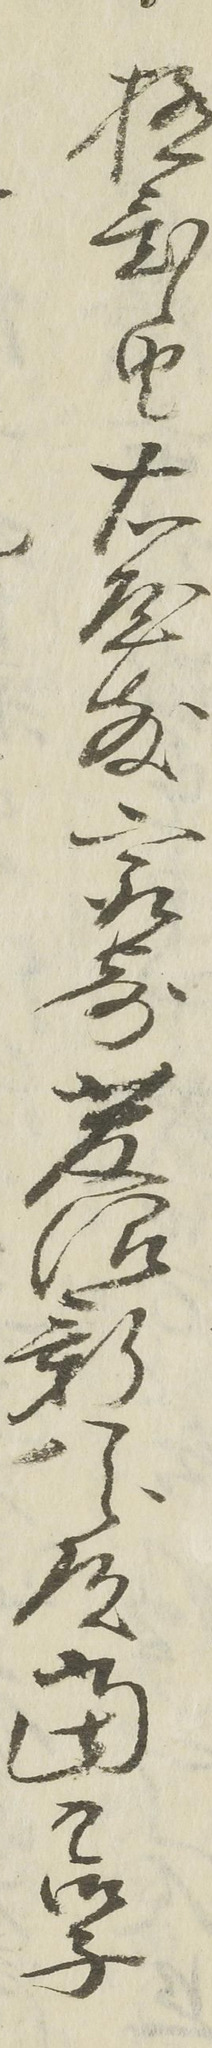極置候由右屋敷最寄菅沼新八郎殿当主御子
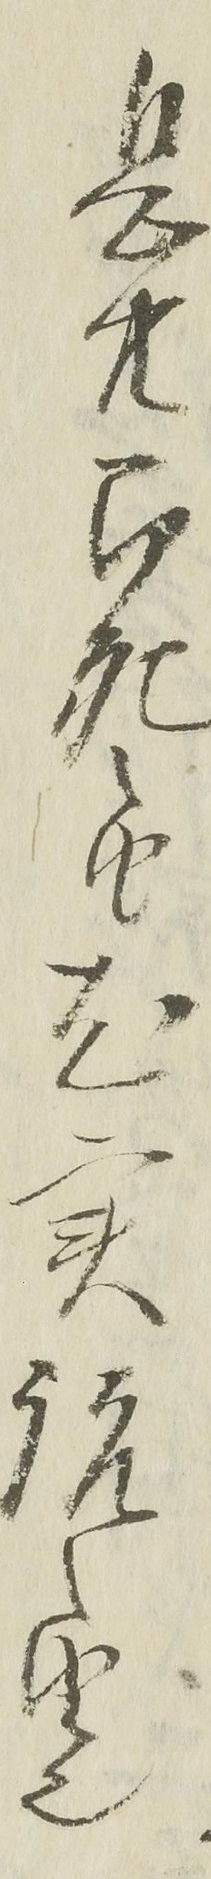息共即死之由尤実説之由也

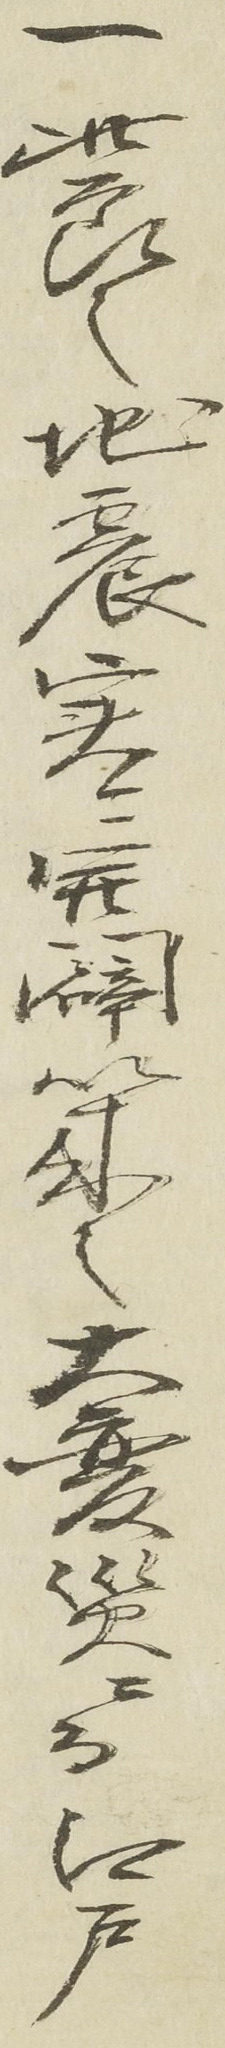一此節之地震実ニ開闢以来之大変災二而江戸
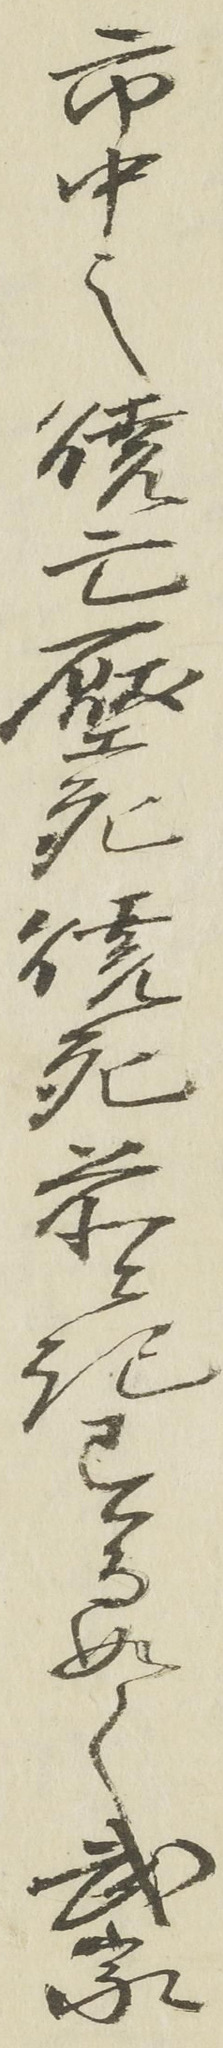市中之焼亡圧死焼死前ニ記する如く武家
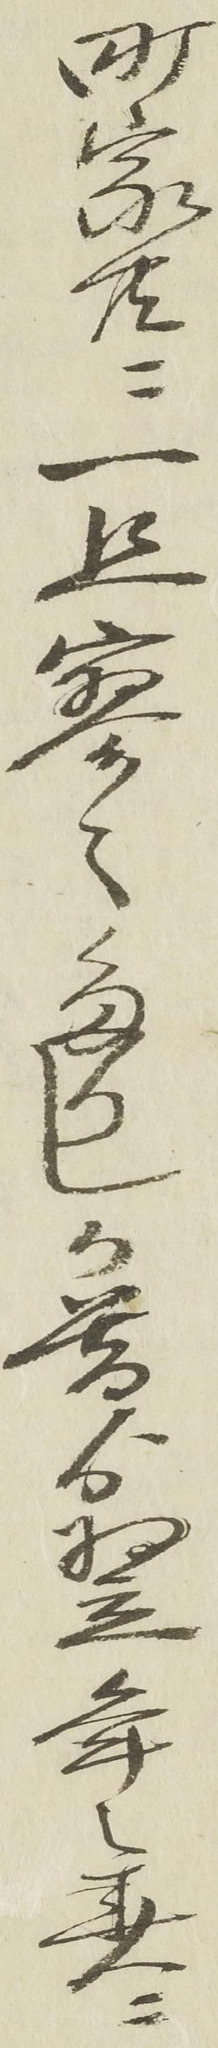町家共二一旦寥〻たりしか暮ゟ翌年之春二
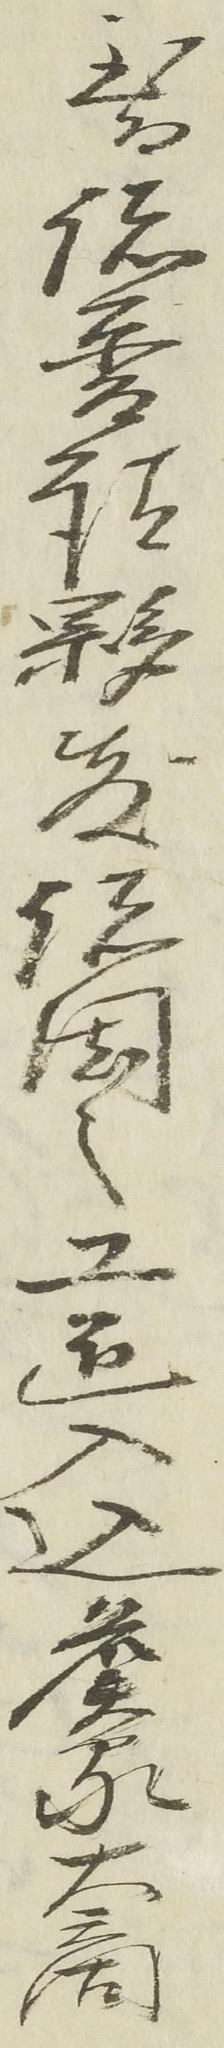至而諸普請夥敷諸国之工匠入込侯家大商
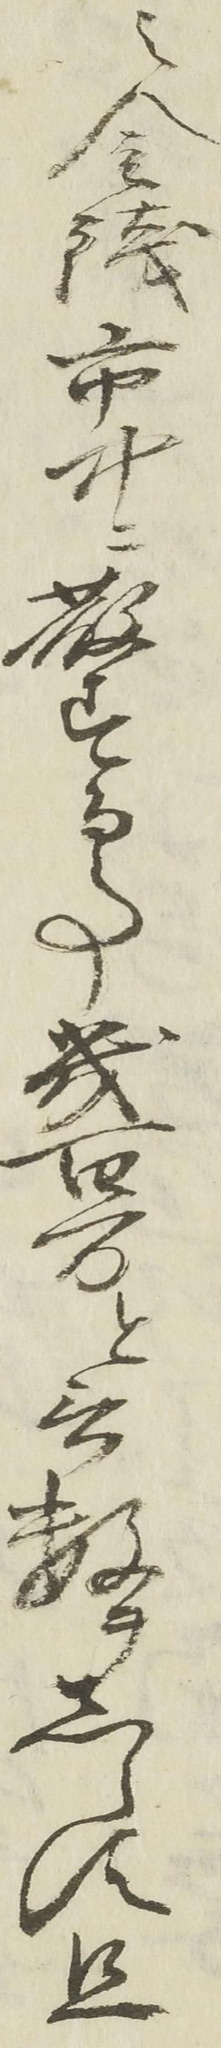之金銭市中二散する事幾百万と言数ヲしらす且
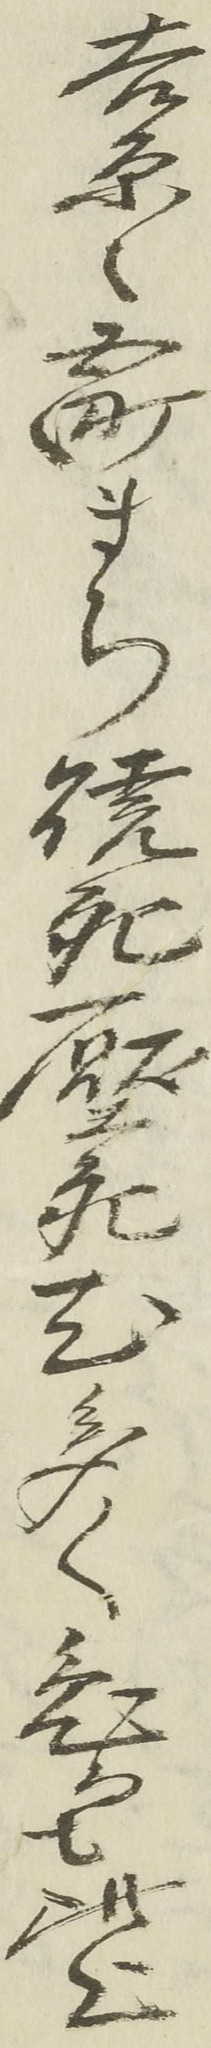吉原之五町まち焼死圧死尤多く兎而も此上
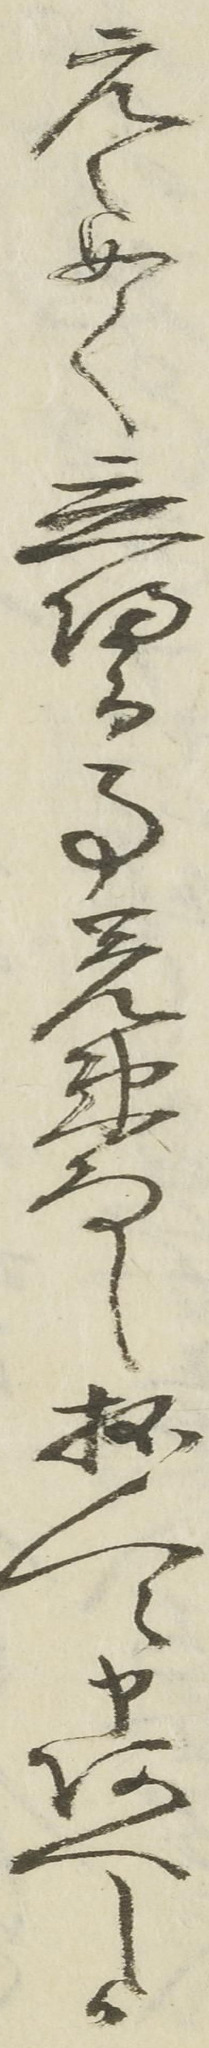元之如く立帰る事覚束なし抔人〻申あへし候
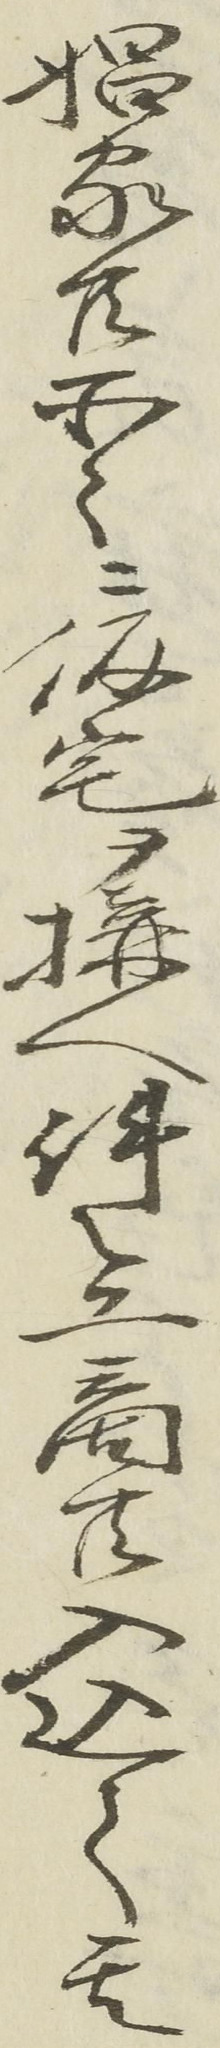娼家共所〻二仮宅ヲ構へ件之工商共入込て其
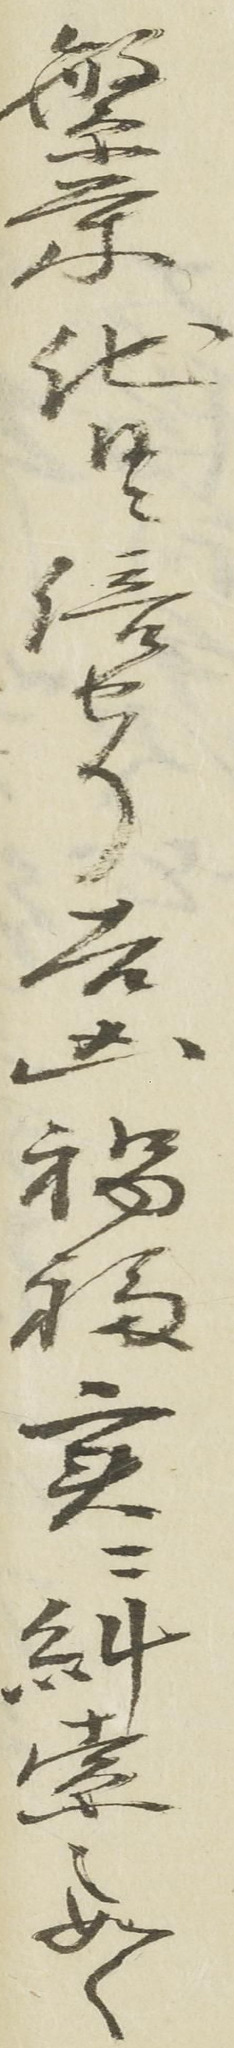繁栄他日二倍セリ吉凶禍福実二糾索之如く
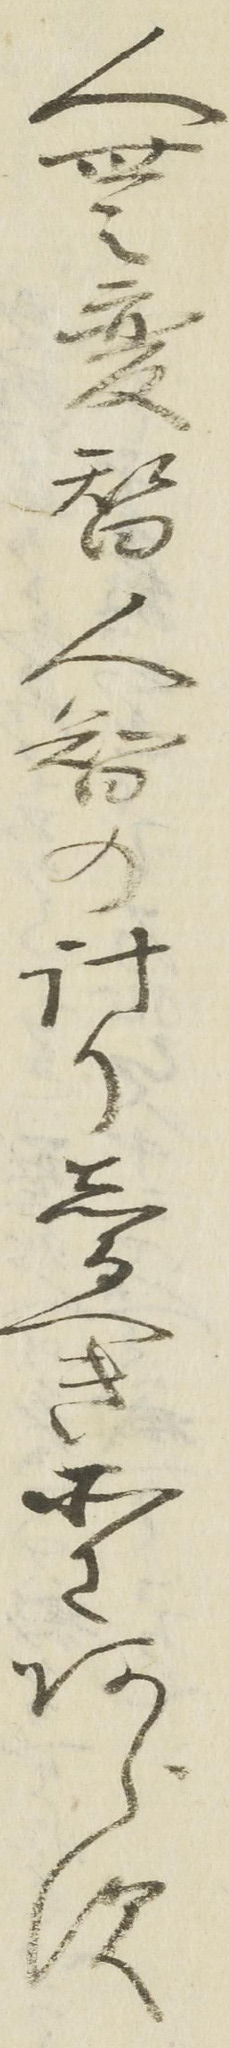人世之変智人智の計りしるへき所にあらす
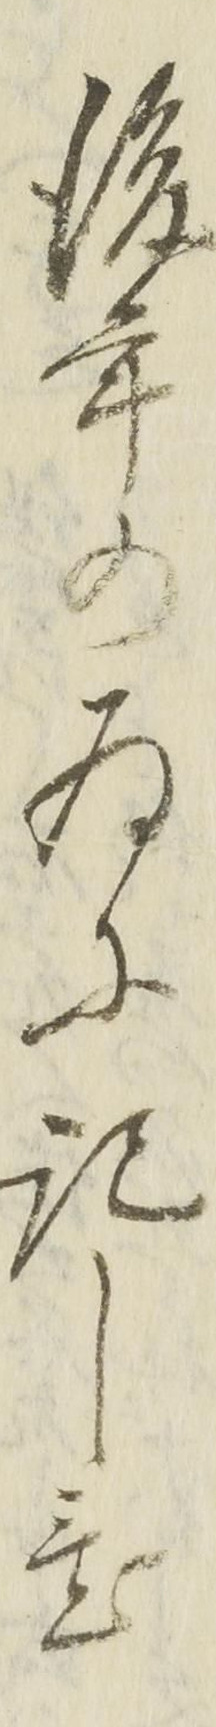後年の為に記し置
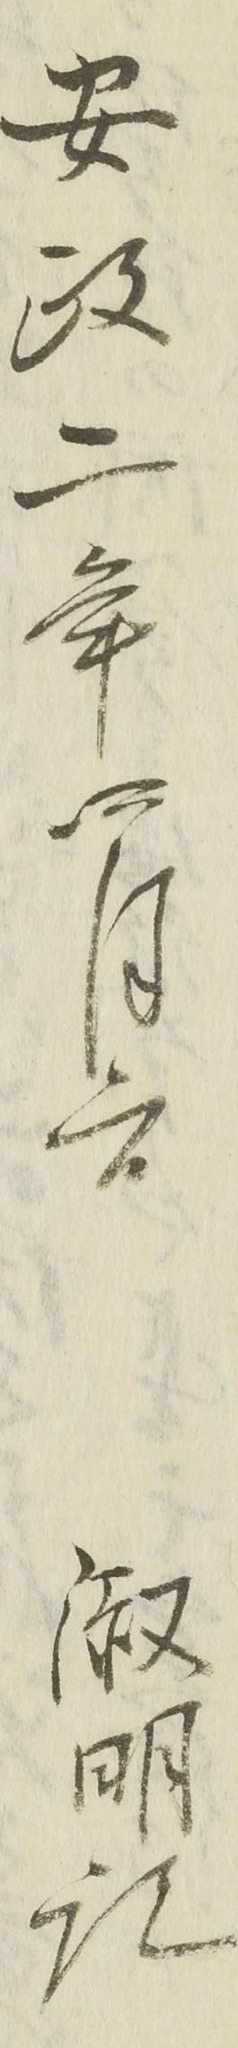安政二年四月二日淑明記
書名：安政乙卯江戸大地震筆記　安政丙辰八月大阪大雷雨之記追加　安政三辰年七月松前辺大地震并八月大風雨記録
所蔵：東京大学地震研究所図書室 Earthquake Research Institute Library, The University of Tokyo, JAPAN
